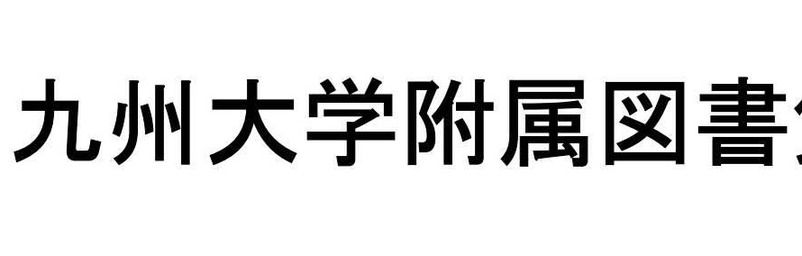九州大学付属図書館
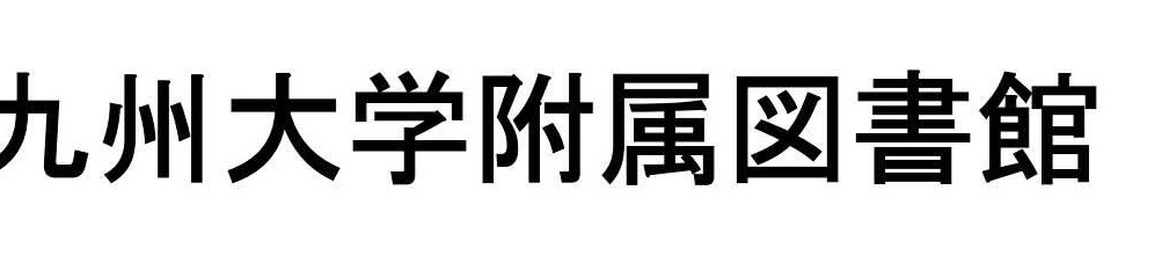九州大学付属図書館

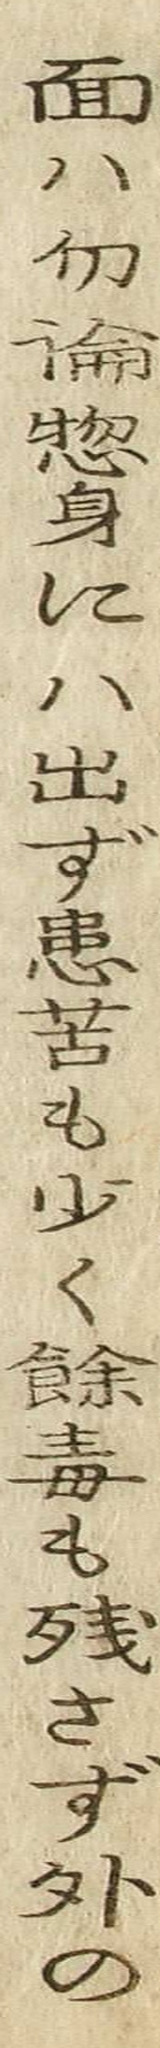面ハ勿論惣身にハ出ず患苦も少く餘毒も残さず外の
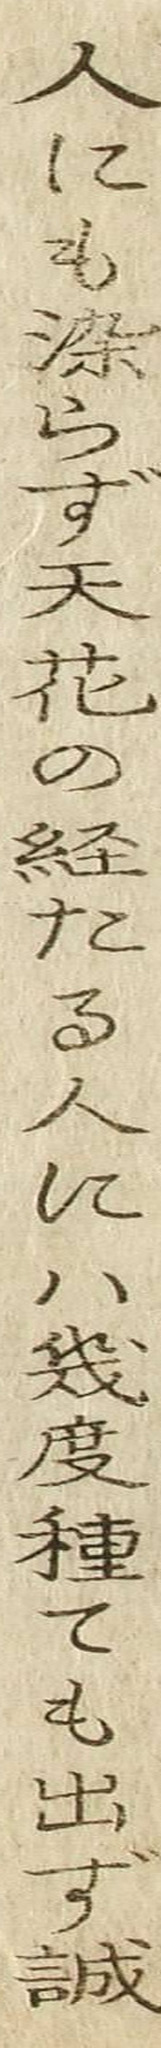人にも染らず天花の経たる人にハ幾度種ても出ず誠
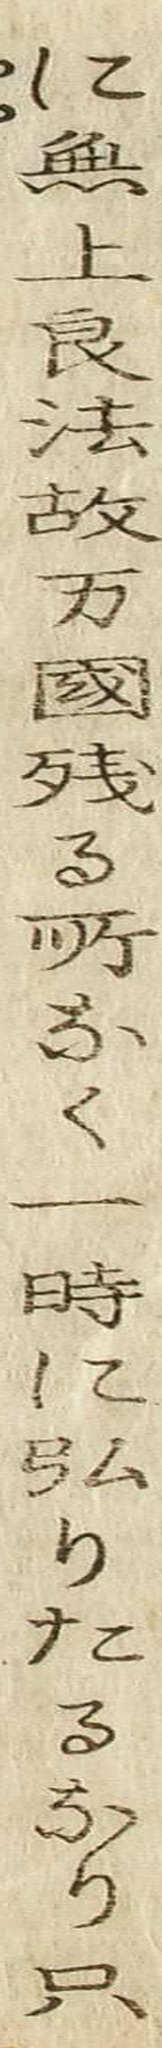に無上良法故万國残る所なく一時に弘りたるなり只
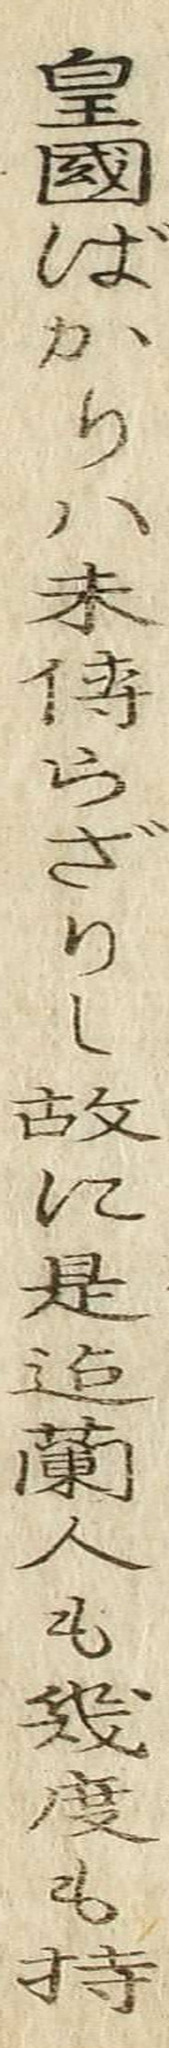皇國ばかりハ未傳らざりし故に是迠蘭人も幾度も持
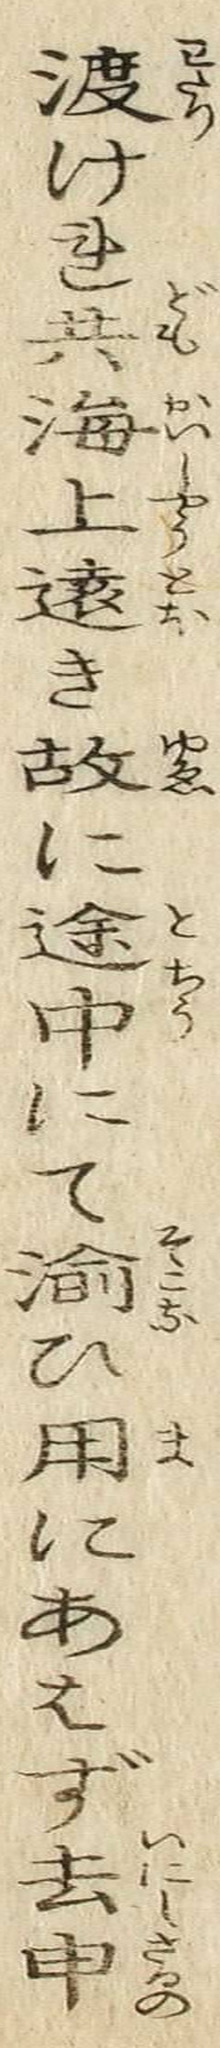渡けれ共海上遠き故に途中にて渝ひ用にあはず去申
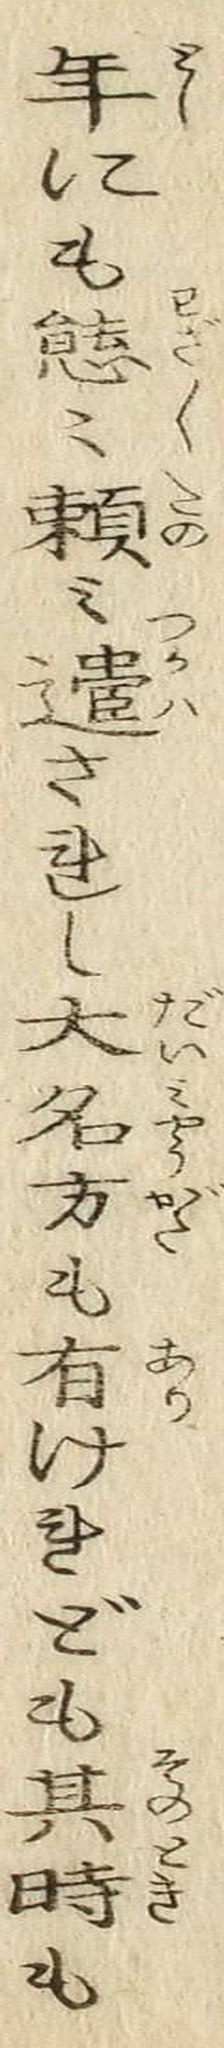年にも態々頼み遣されし大名方も有けれども
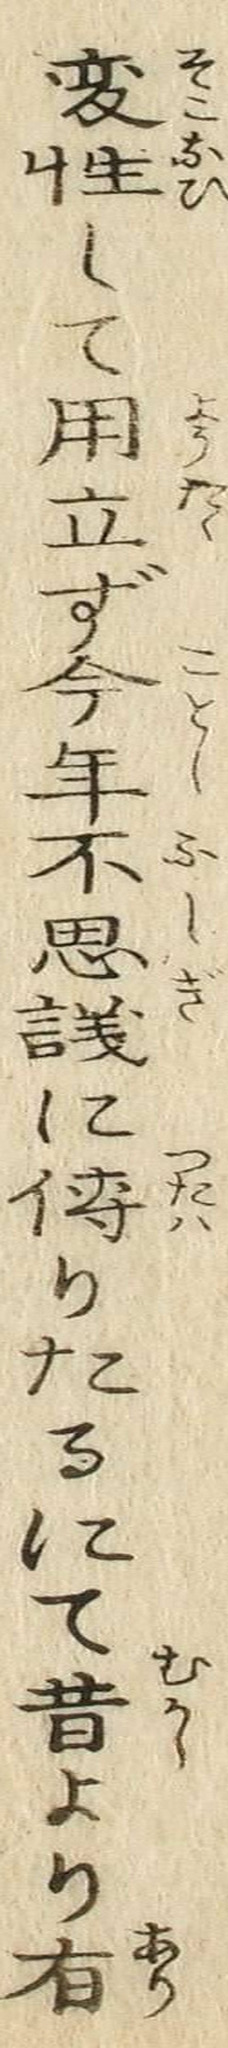変性して用立ず今年不思議に傳りたるにて昔より有
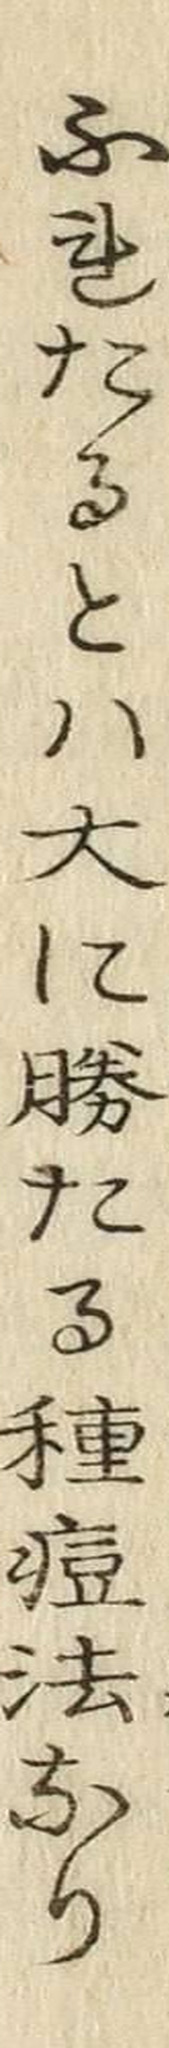ふれたるとは大に勝たる種痘法なり
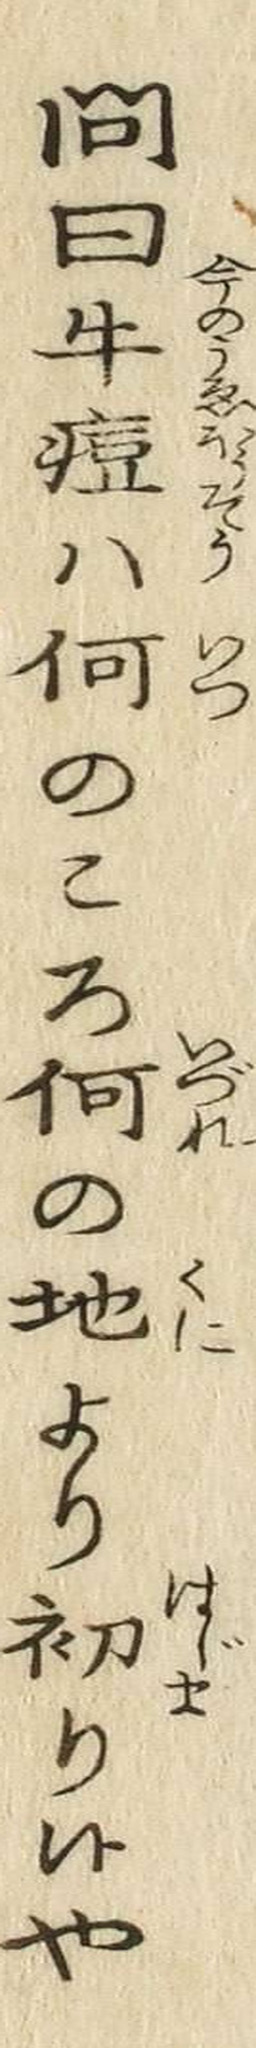問曰牛痘は何のころ何の地より初り候や
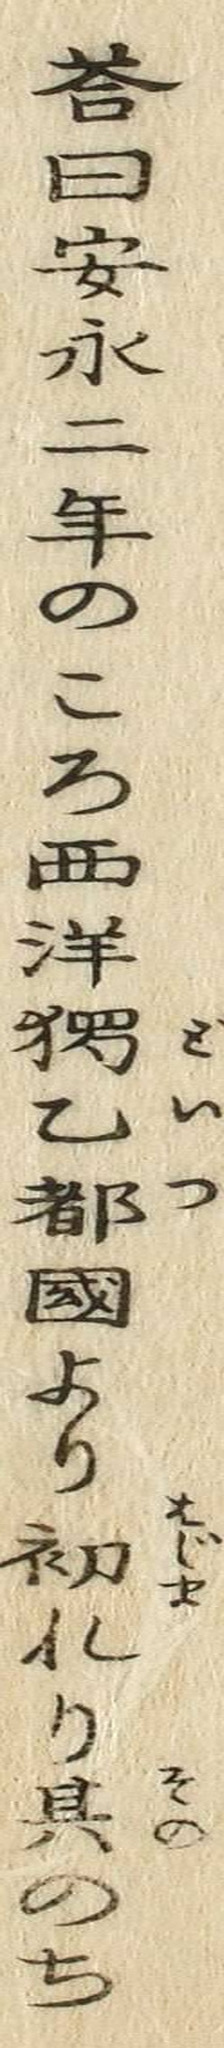答曰安永二年のころ西洋獨乙都國より初れり其のち
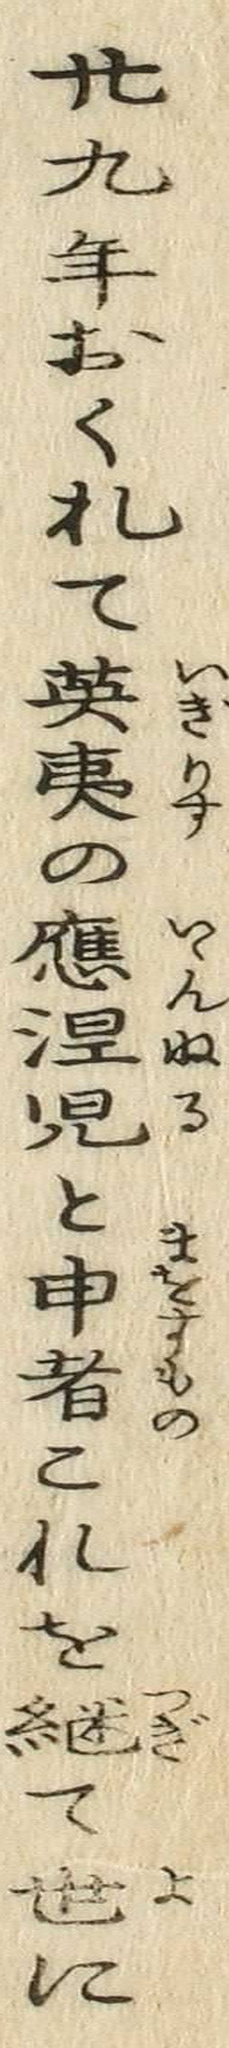廿九年おくれて英夷の應涅児と申者こえを継て世に
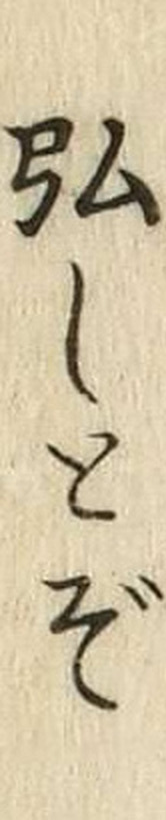弘しとぞ
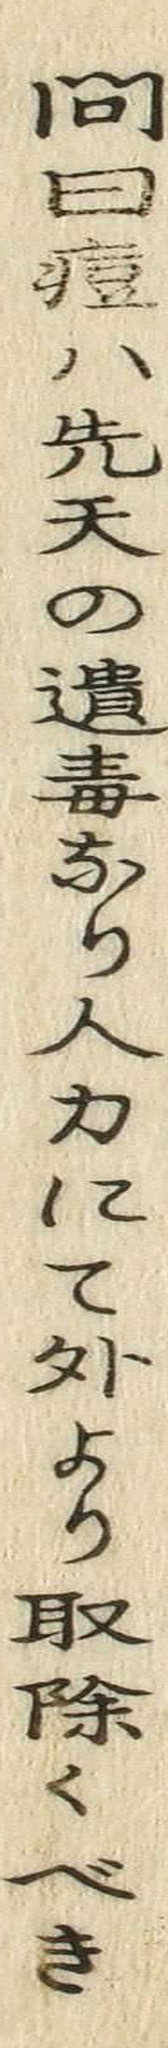問曰痘は先天の遺毒なり人力にて外より取除くべき
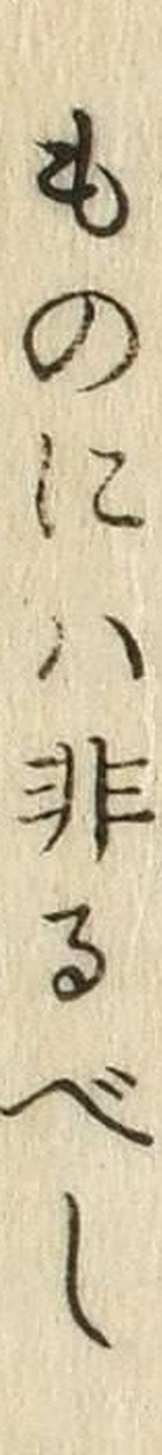ものには非るべし
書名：牛痘問答
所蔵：九州大学医学図書館 国文学研究資料館
